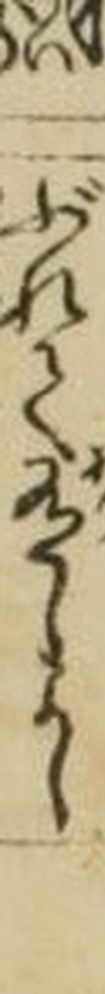ぶれて有しよし
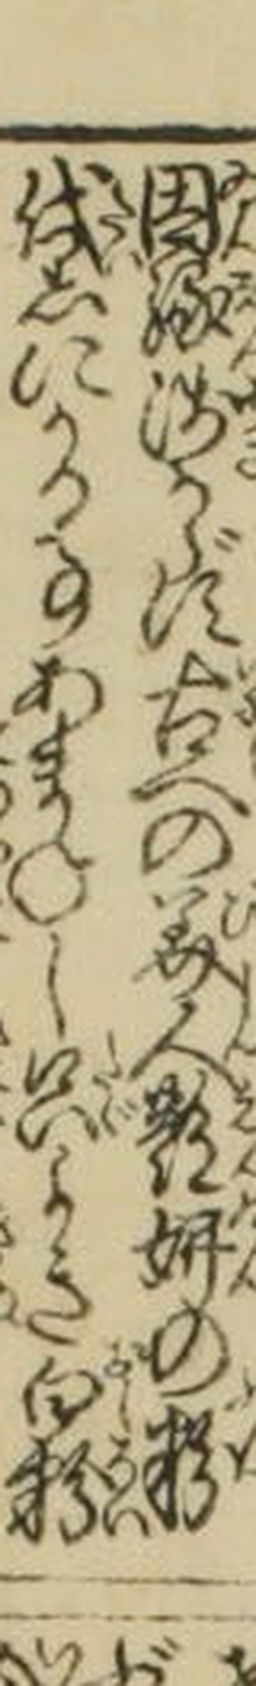黛にかる事あまねし只よき白粉
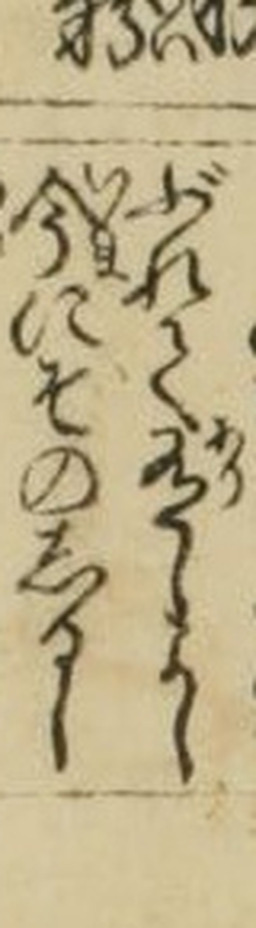今にそのしるし
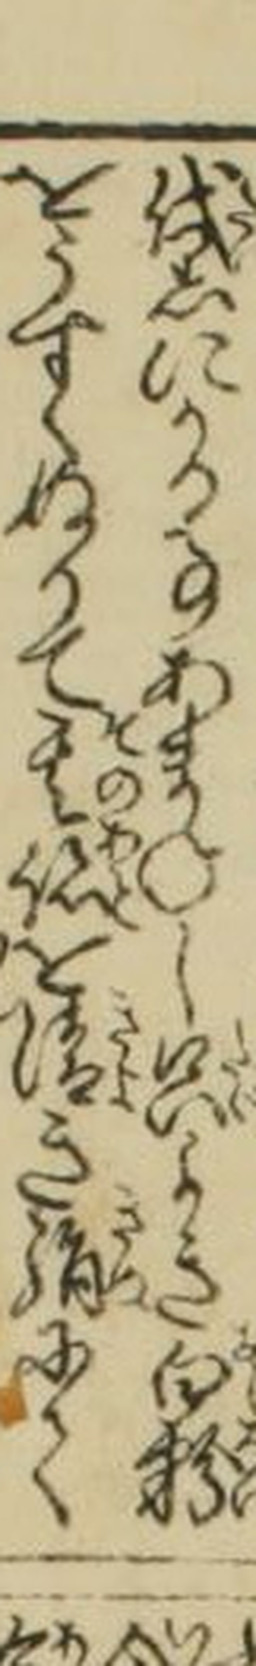をうすくぬりて其跡を清き絹にて
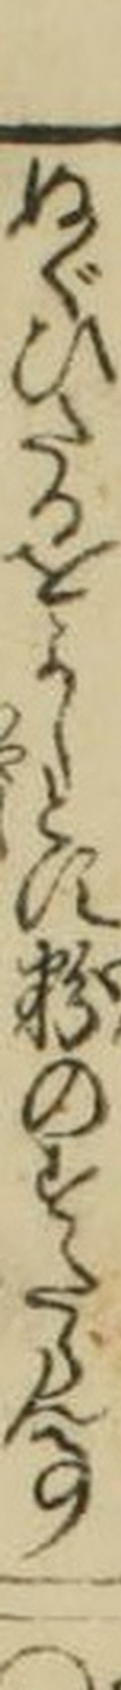ぬぐひたるをよしとす粉のすたらん事
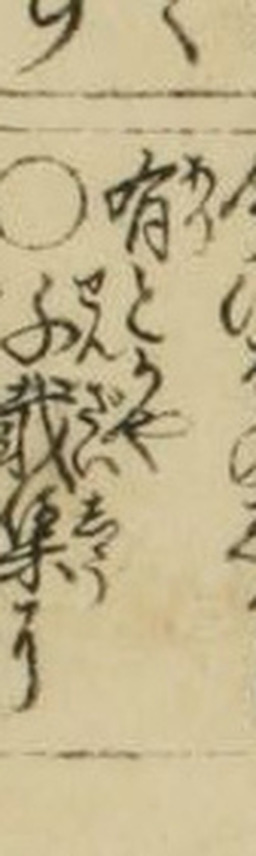◯千載集に
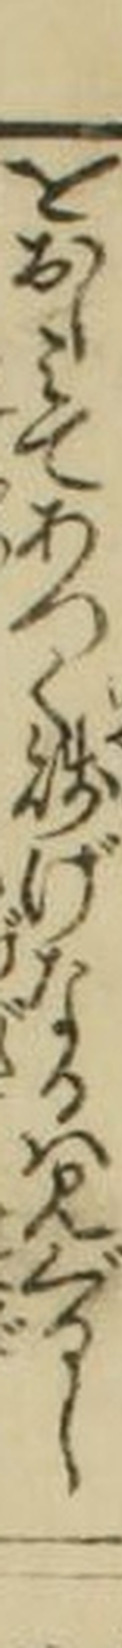をおしみてあつく賤げなるは見ぐるし
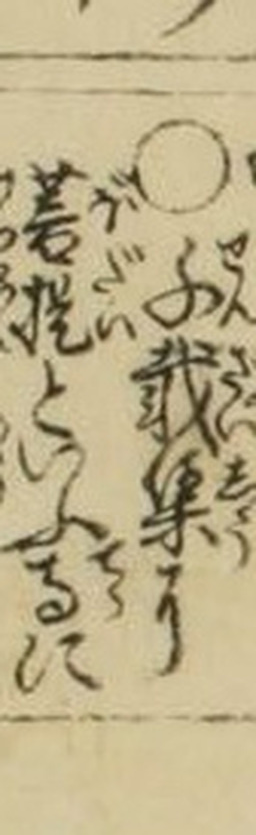菩提といふ鳥に
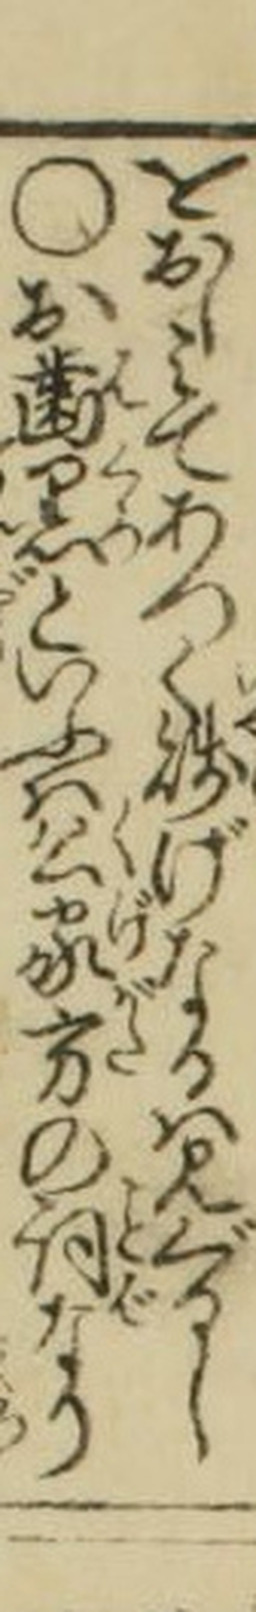◯お歯黒といふは公家方の詞なり
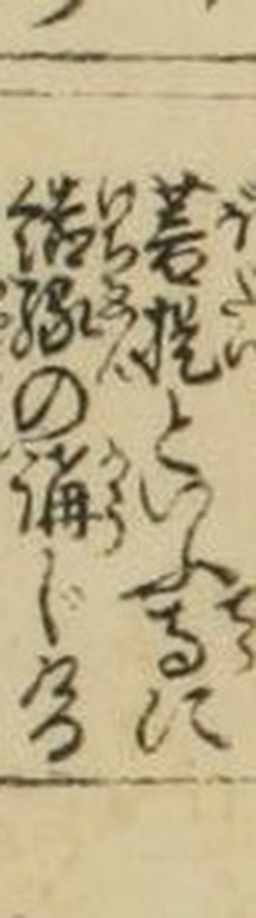結縁の講じける
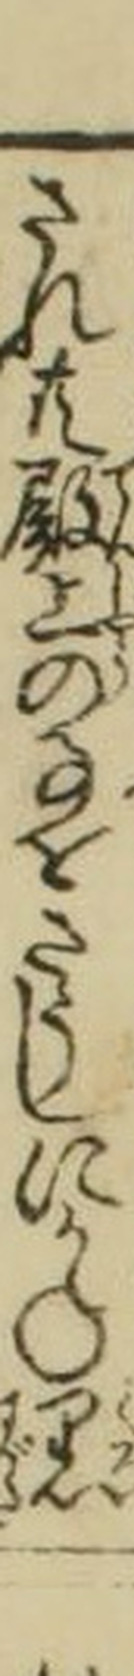され共殿上の事をさうしにかね黒
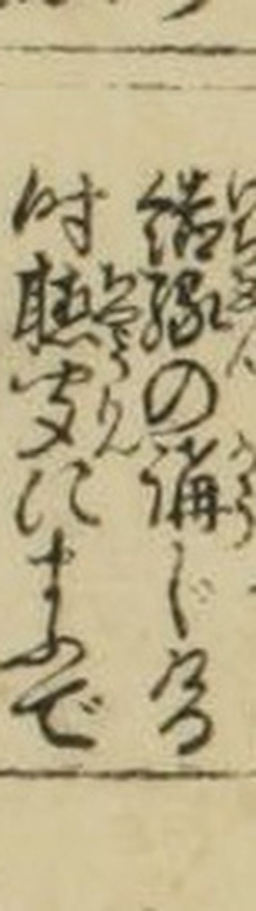時聴聞にまふで
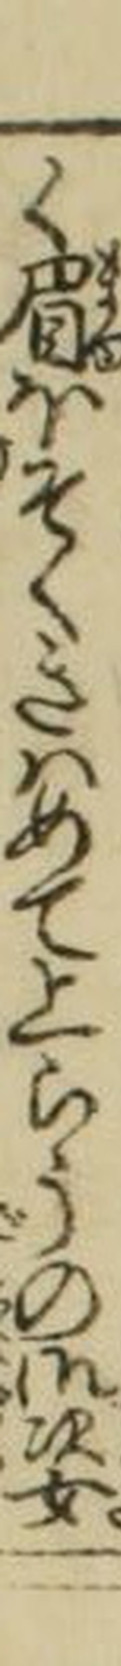く眉ほそくきはめて上らうの御姿
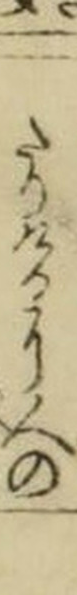たりけるに人の
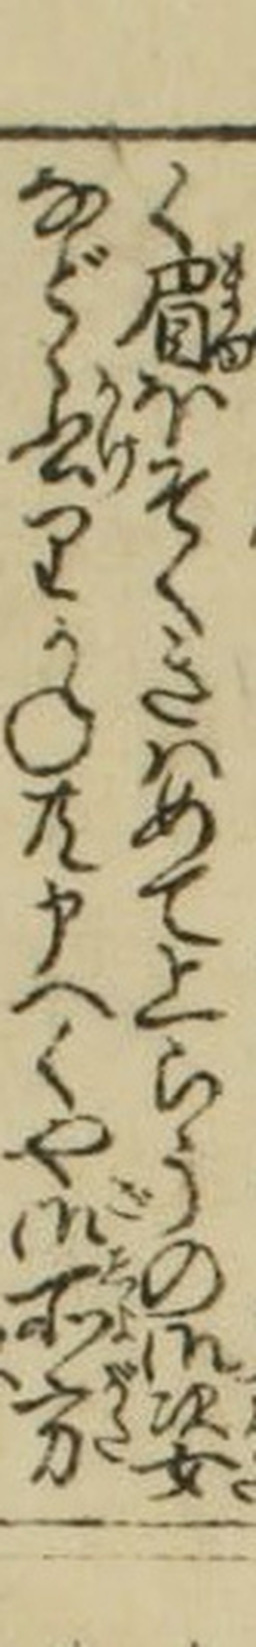などゝ書りかね共申べくや御所方
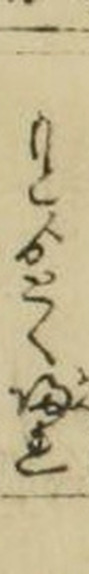もとよりとく帰れ
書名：女源氏教訓鑑
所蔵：東京学芸大学附属図書館
